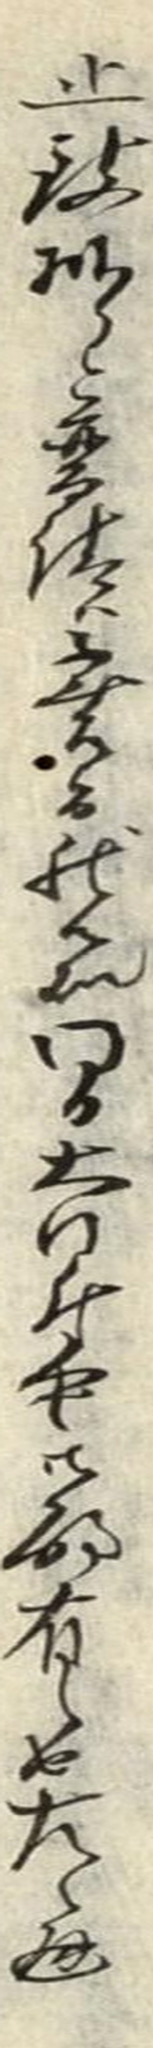止致掛り候普請は不苦旨然ル処同日大目付中御触有之由左之通
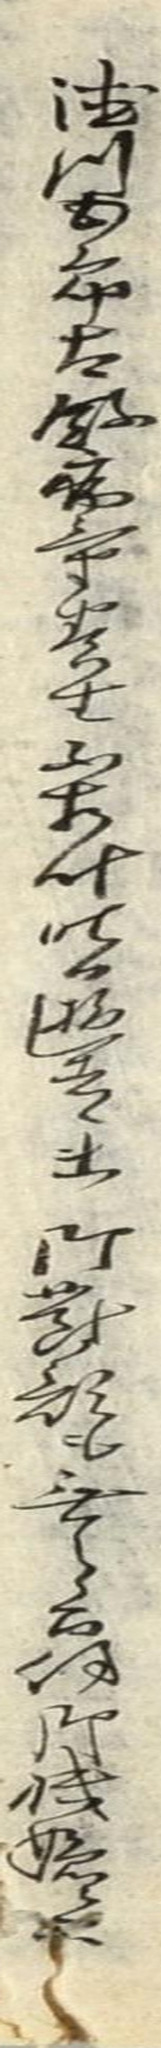徳川五郎太殿病気養生不相叶昨日逝去候未御対顔も無之候間伺御機嫌に不
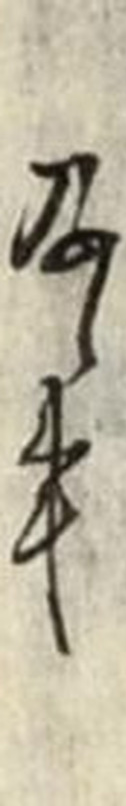及候事
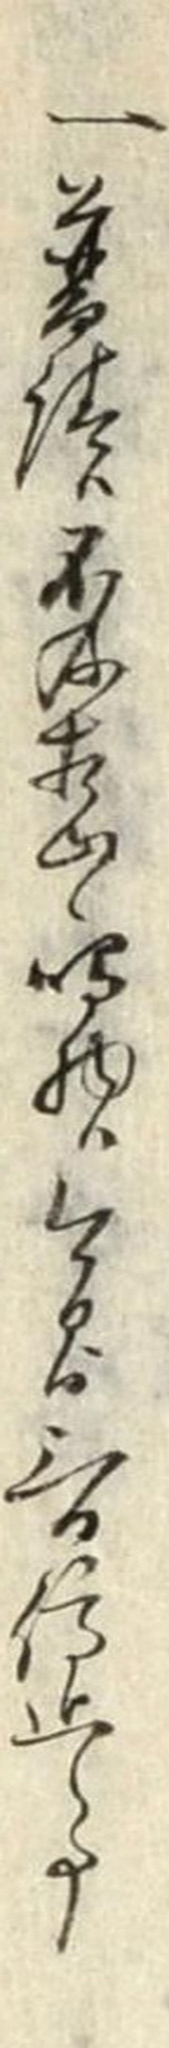一普請は不及相止候鳴物は今日ゟ三日停止之事
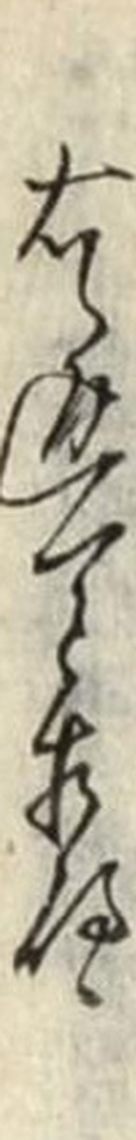右之通可被相触候
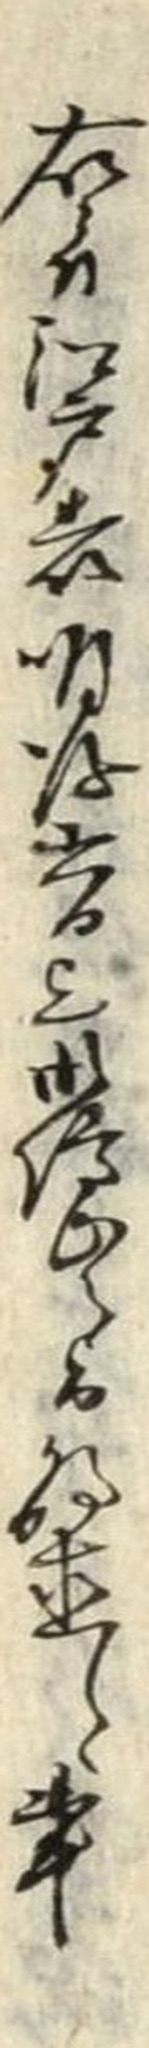右に付江戸表明後六日迄御停止之旨触直し候事
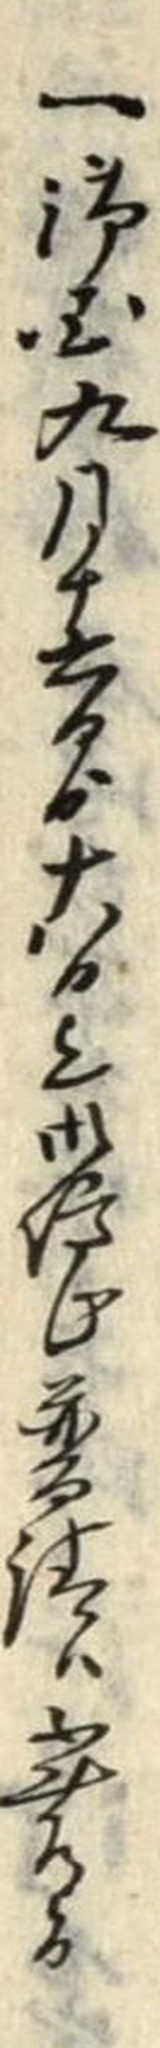一御国九月十六日ゟ十八日迄御停止普請は不苦旨

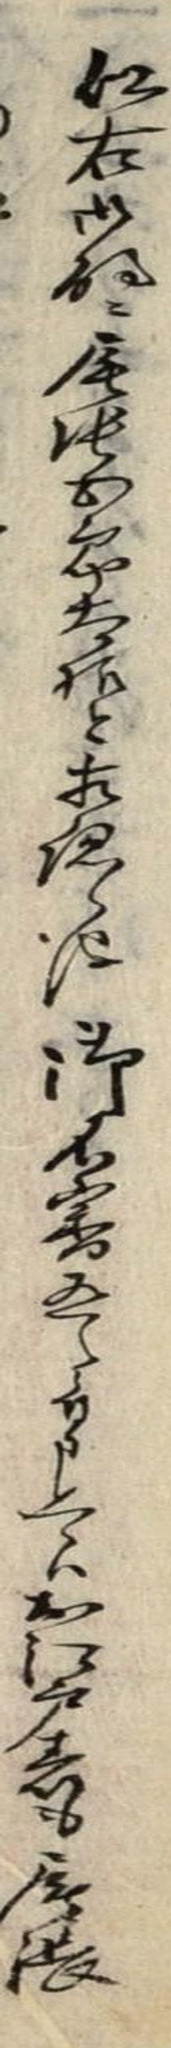但右御触に尾張五郎太様と相認候儀御不審有之に付申上候は於江戸表も尾張
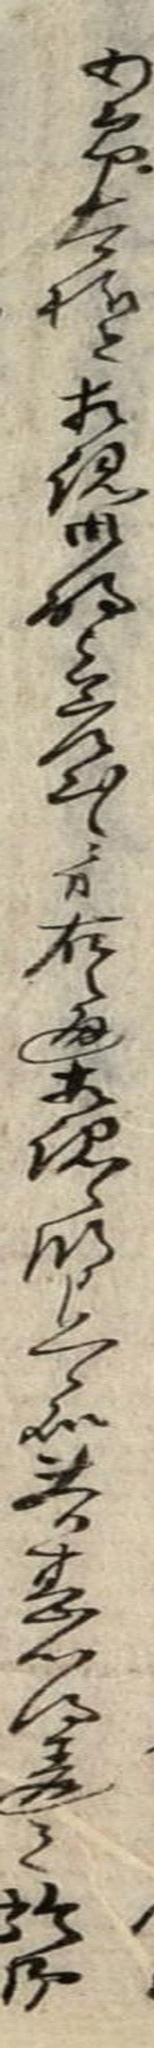五郎太様と相認御触被差出候に付右之通相認候段申上候処夫は甚心得違に候於御
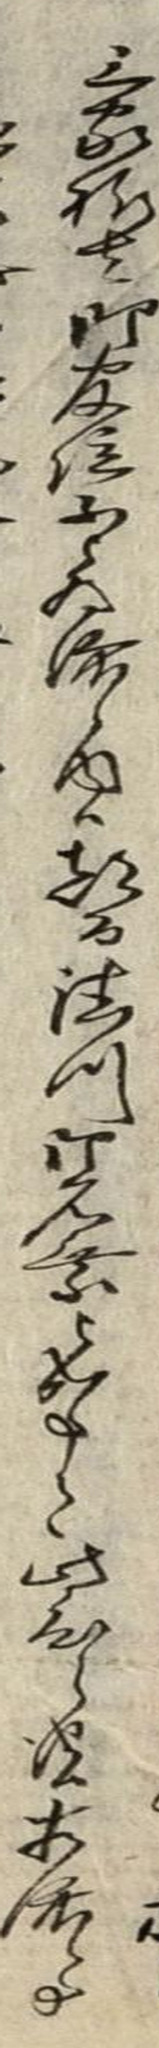三家様は御官位不被為済候内は都て徳川御名乗被成事に候此度之儀は相済候事
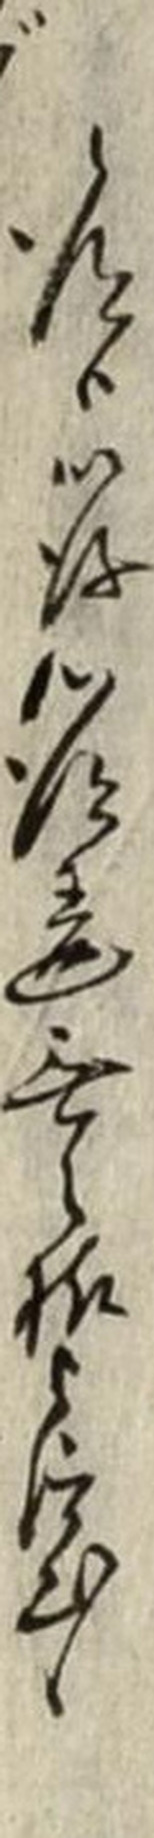候得は以後心得違無之様被仰出候
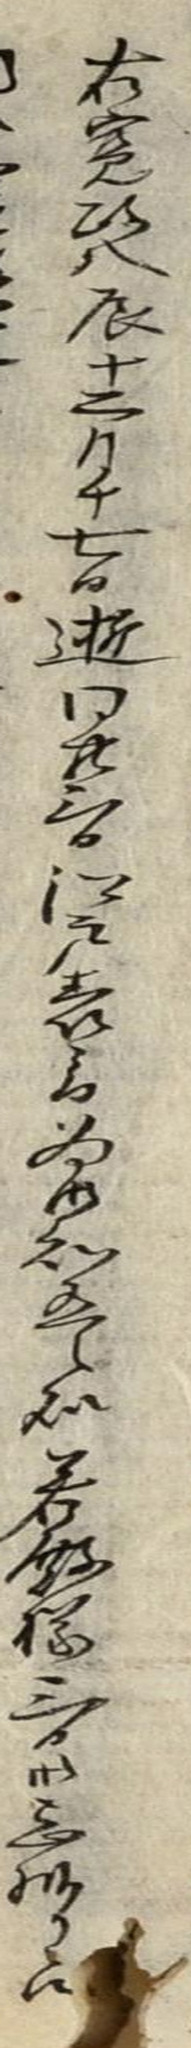右寛政八辰十二月十七日逝同廿三日江戸表にて為御知有之処若殿様三日御忌掛りに候
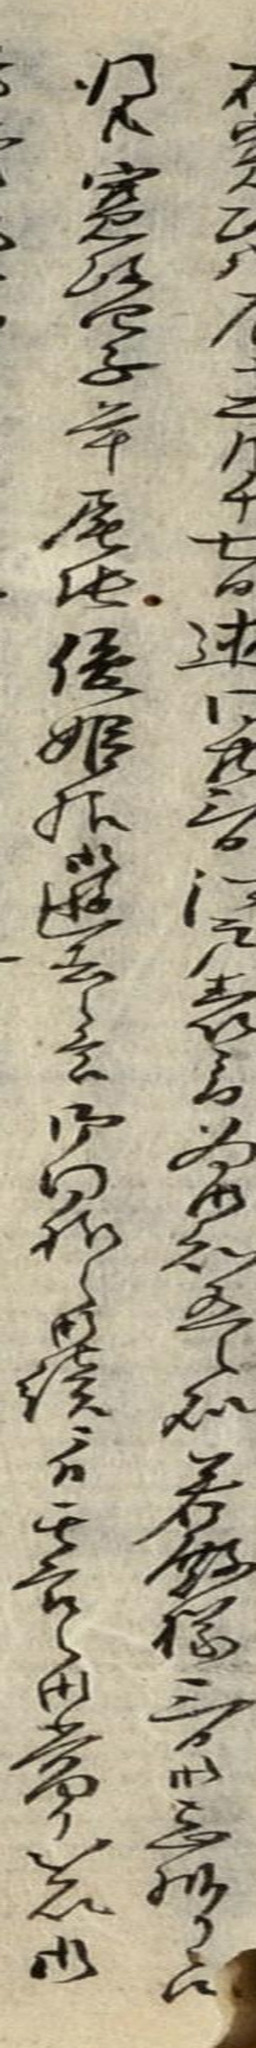得共寛政四子年尾張俊姫様御逝去之節御同様之御続に付其節之御当りを以御
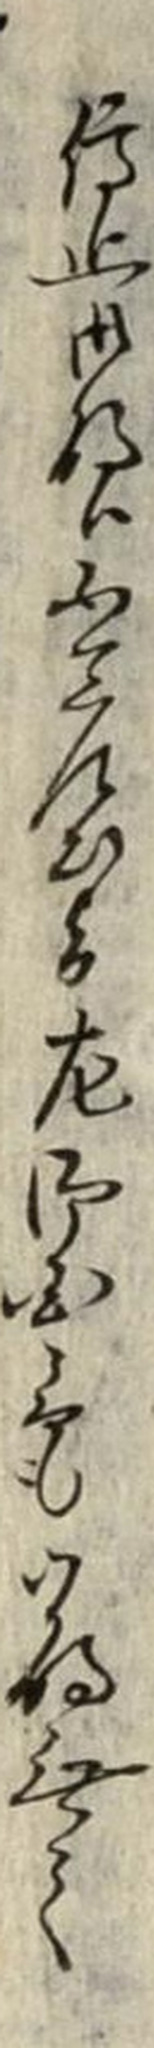停止御触は不差出旨尤御国にても御触無之
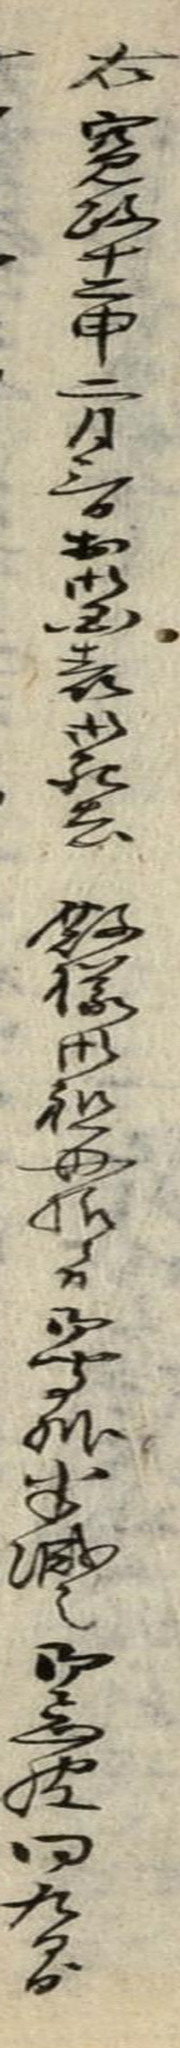右寛政十二申二月三日於御国表御死去殿様御祖母様に付御聞掛半減也御忌服同九日ゟ
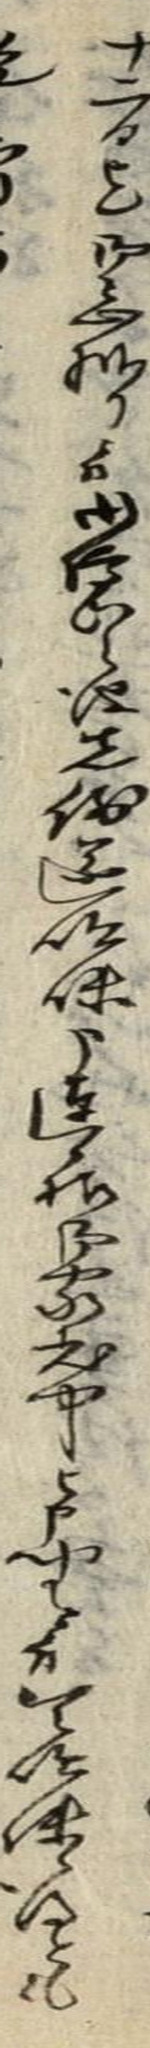十二日迄御忌掛りに付御停止之儀先例遂吟味申達候様御家老中被申聞候に付令吟味候得とも
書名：御停止異変死失
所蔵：福井県文書館 Fukui Prefectural Archives
